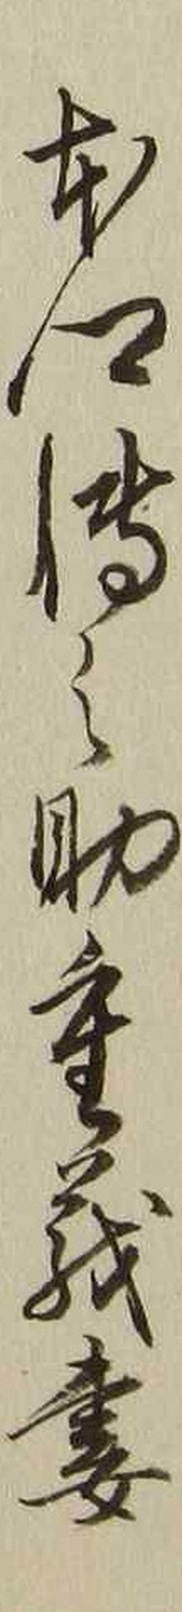本郷伝之助重義妻
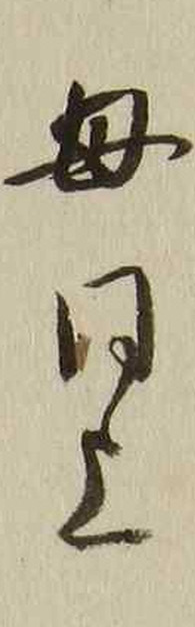母同上
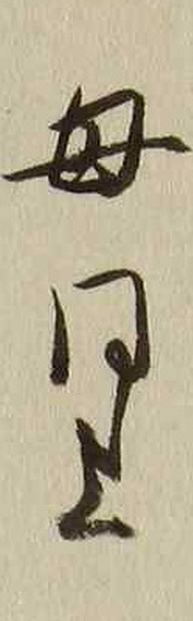母同上
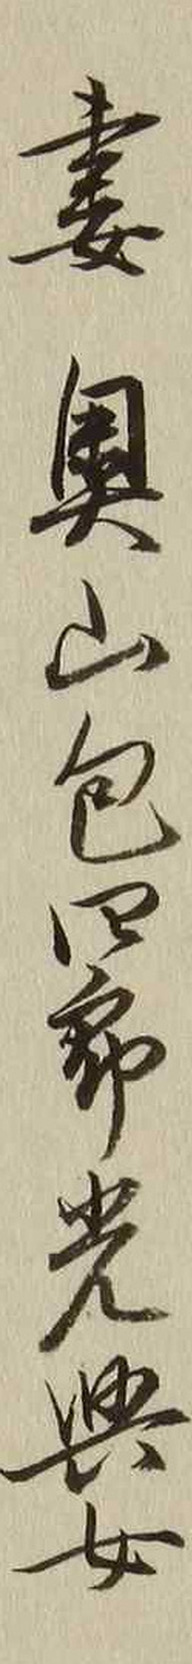妻奥山包四郎光典興女
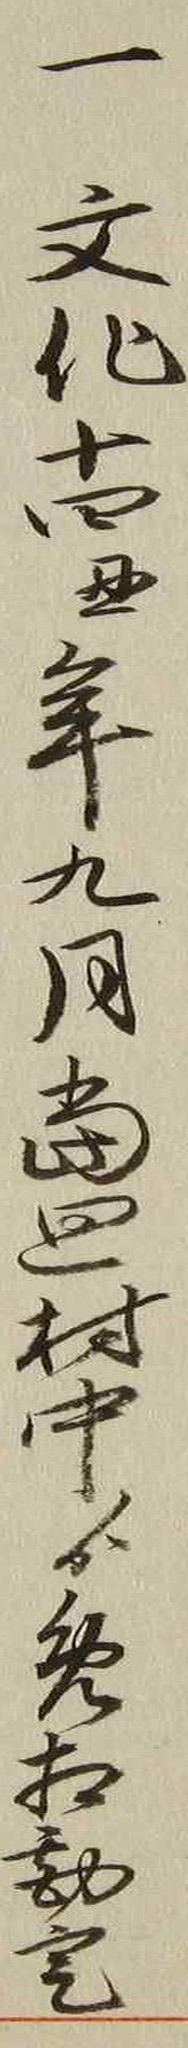一文化十四丑年九月当廻村中ゟ免相勘定
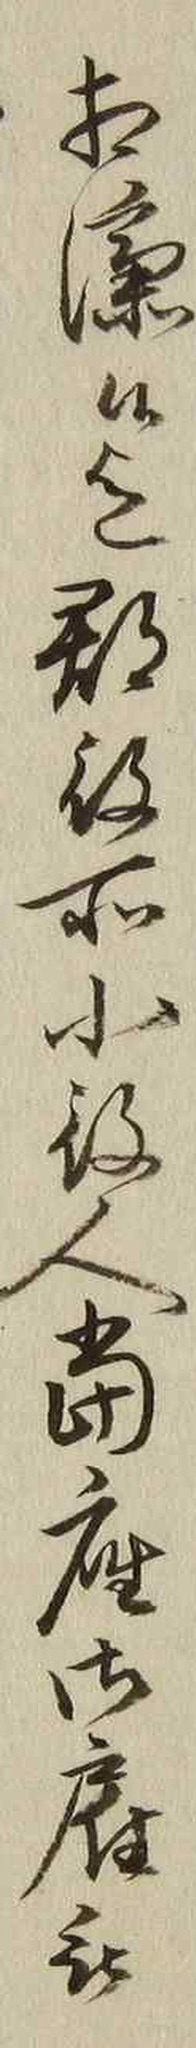相済候迄郡役所小役人当座御雇被
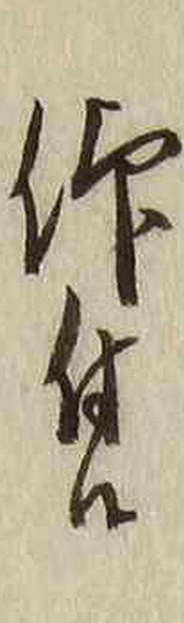仰付候
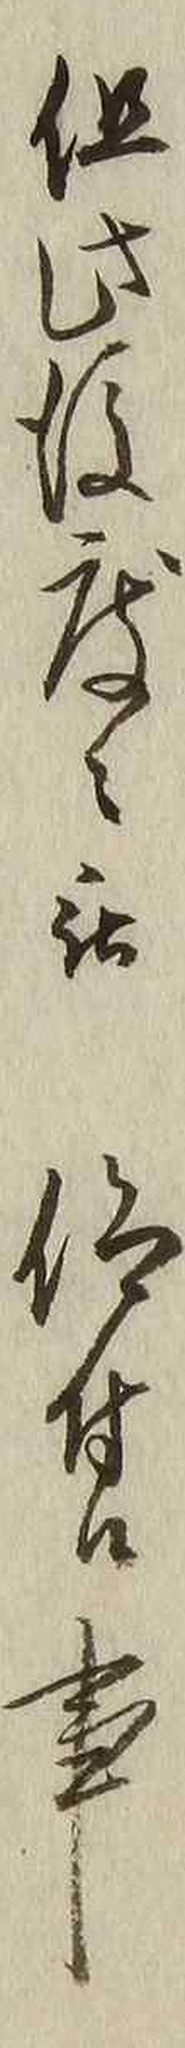但此後度々被仰付候事
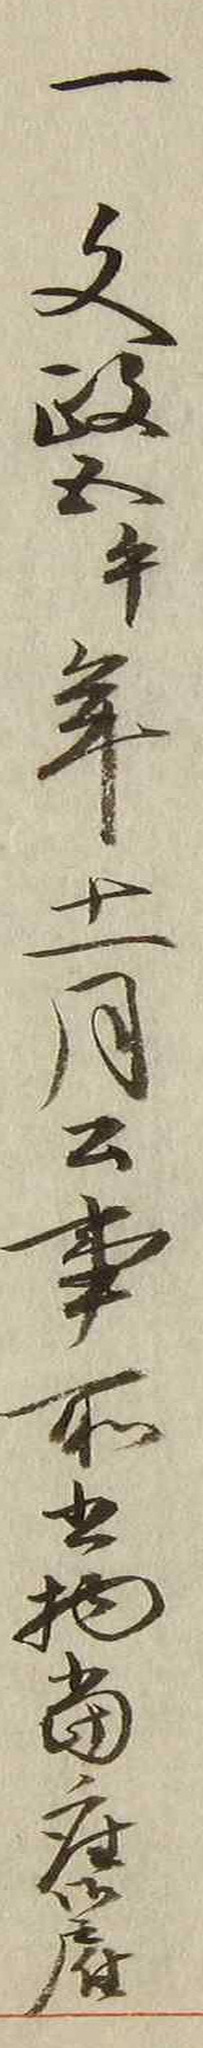一文政五午年十一月公事所書物当座御雇
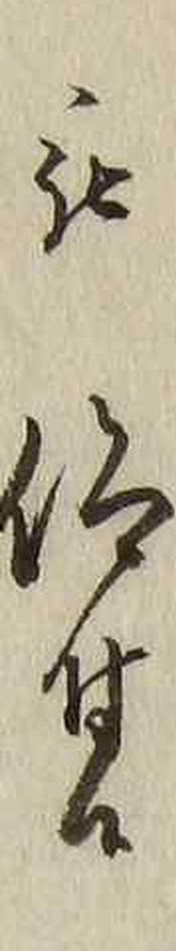被仰付候
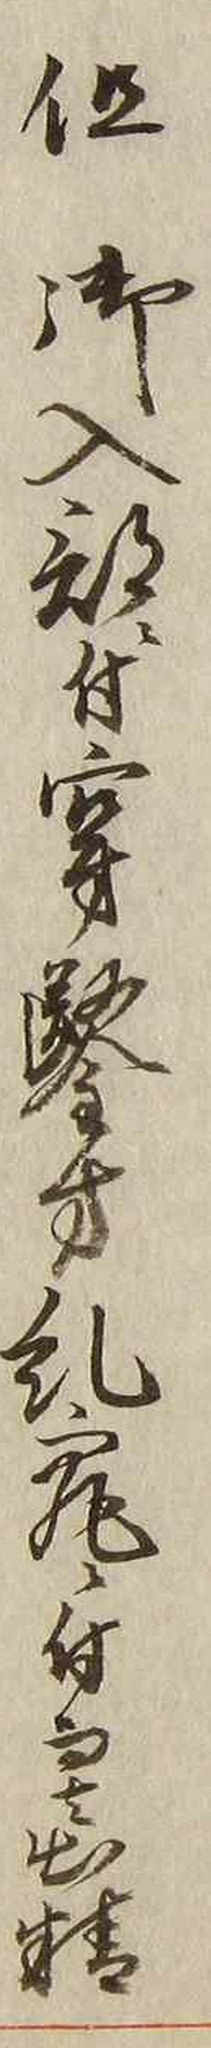但御入部ニ付穿鑿方糺究ニ付而者出精
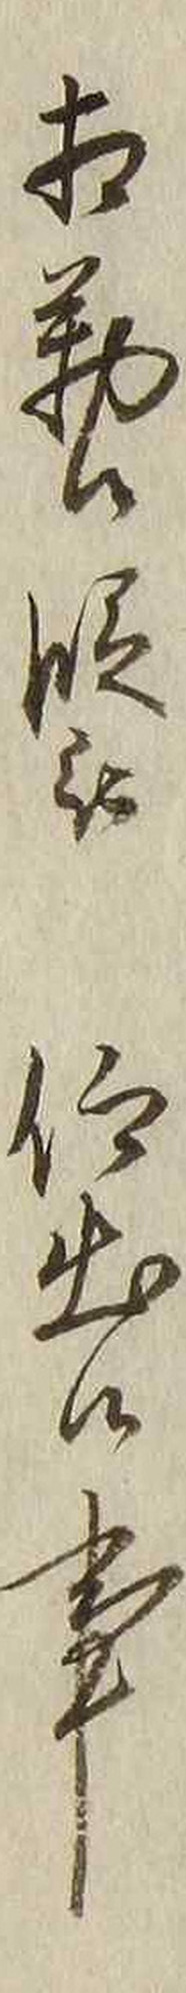相勤候段被仰出候事

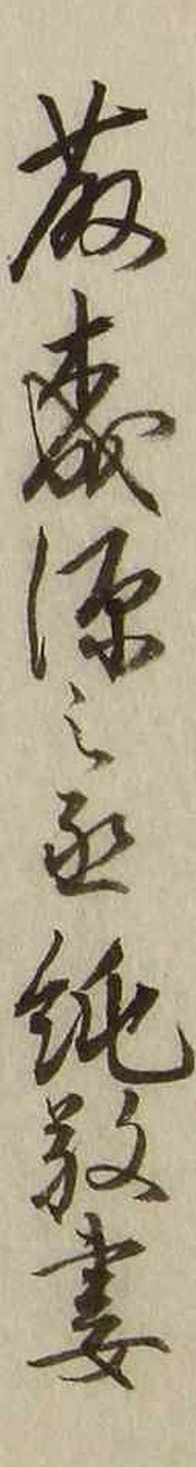女藤森源之丞純敬妻
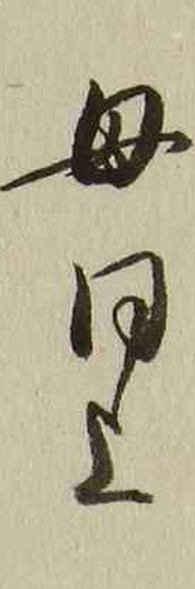母同上
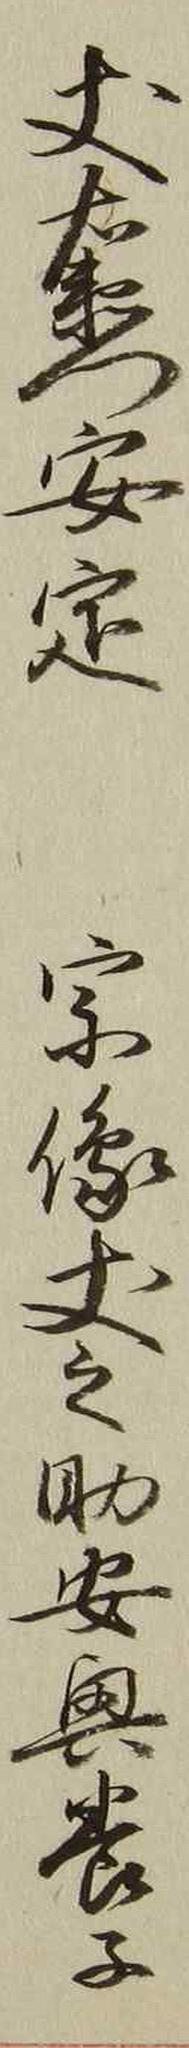丈右衛門安定宗像丈之助安奥養子
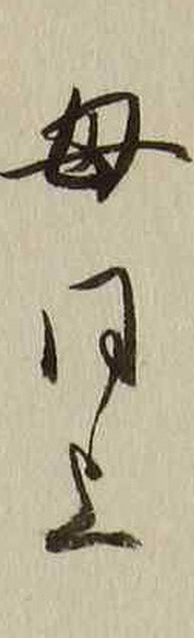母同上
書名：諸士系譜　巻之102　か之部10
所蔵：会津若松市立会津図書館
